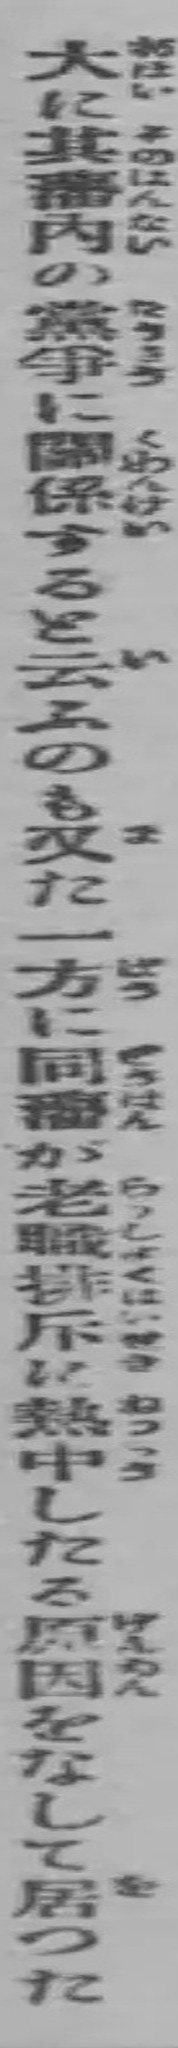大に其藩内の党争に関係すると云ふのも又た一方に同藩が老職排斥に熱中したる原因をなして居つた

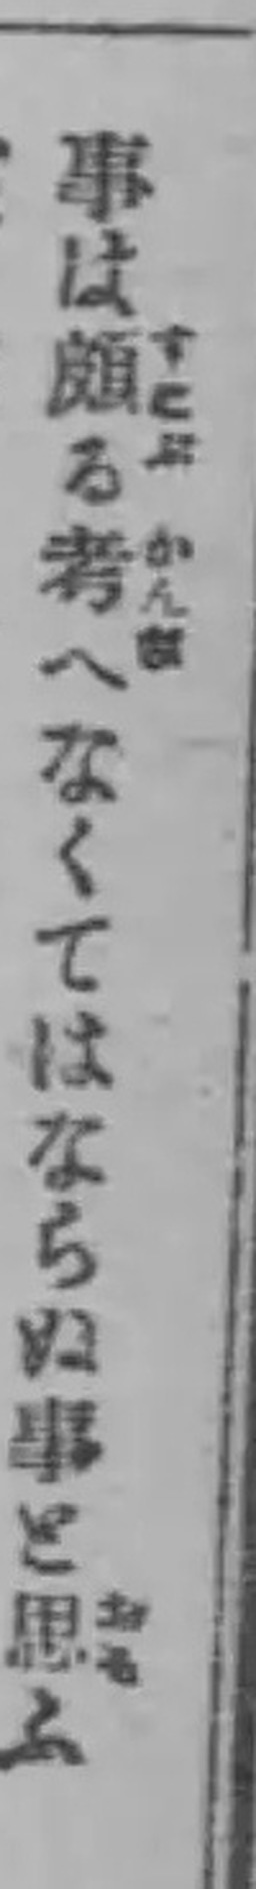事は頗る考へなくてはならぬ事と思ふ
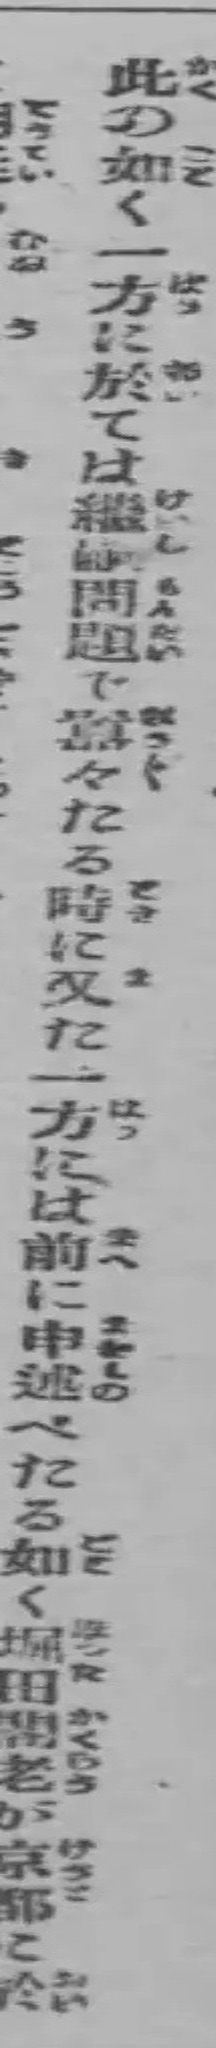此の如く一方に於ては継嗣問題で囂々たる時に又た一方には前にも申述べたる如く堀田閣老が京都に於
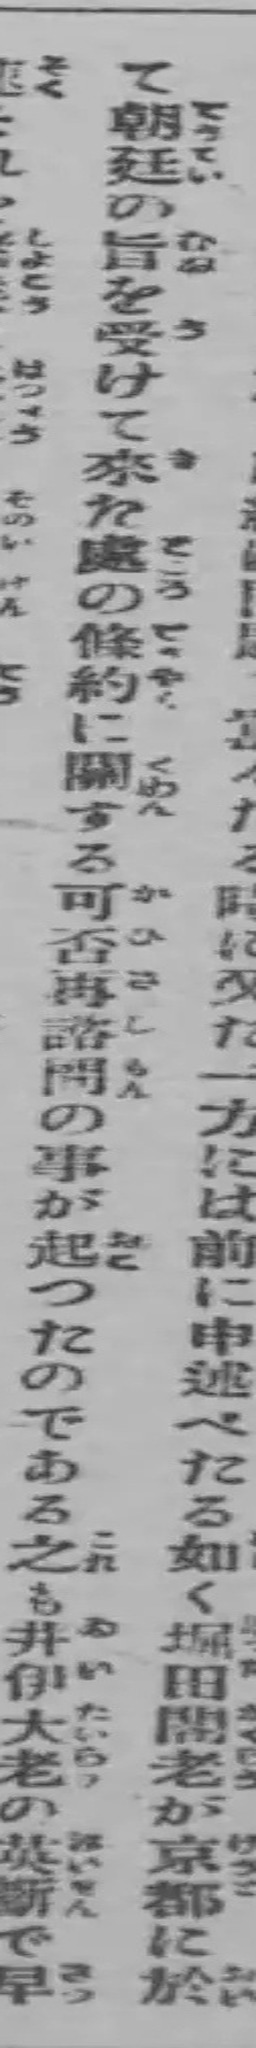て朝廷の旨を受けて来た処の条約に関する可否再諮問の事が起つたのである之も井伊大老の英断で早
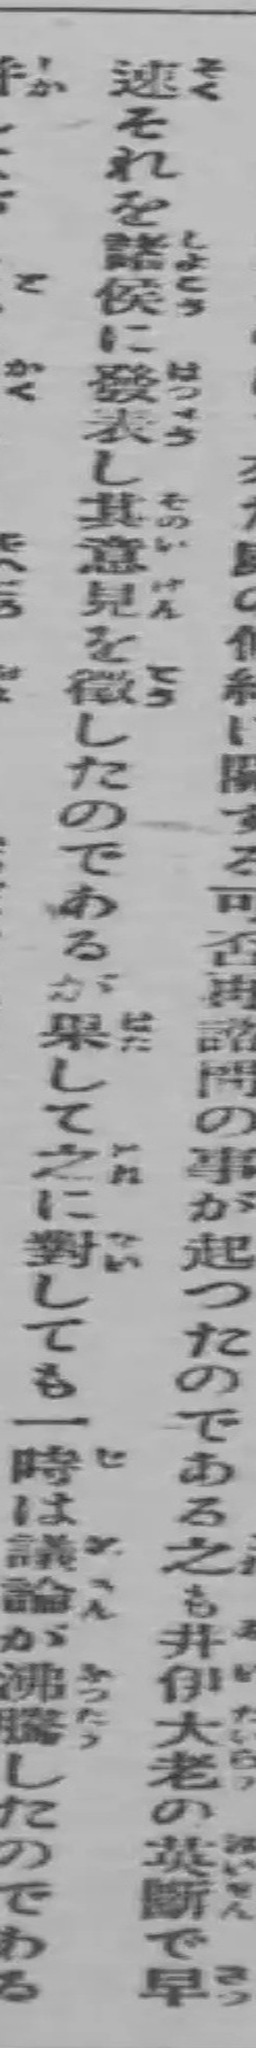速それを諸侯に発表し其意見を徴したのであるが果して之に対しても一時は議論が沸騰したのである
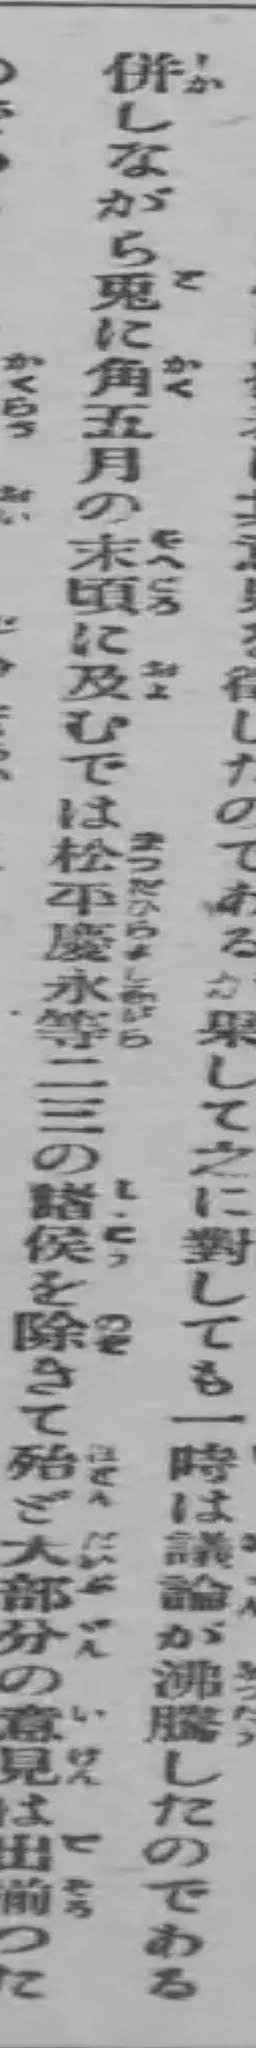併しながら兎に角五月の末頃に及むでは松平慶永等二三の諸侯を除きて殆ど大部分の意見は出揃つた
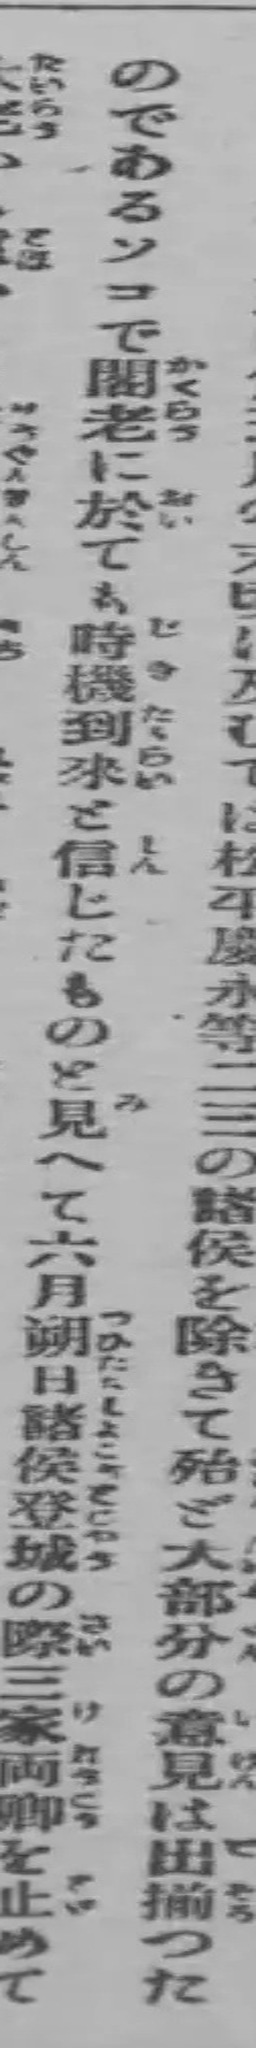建儲の発表のであるソコで閣老に於ても時機到来と信じたものと見へて六月朔日諸侯登城の際三家両卿を止めて
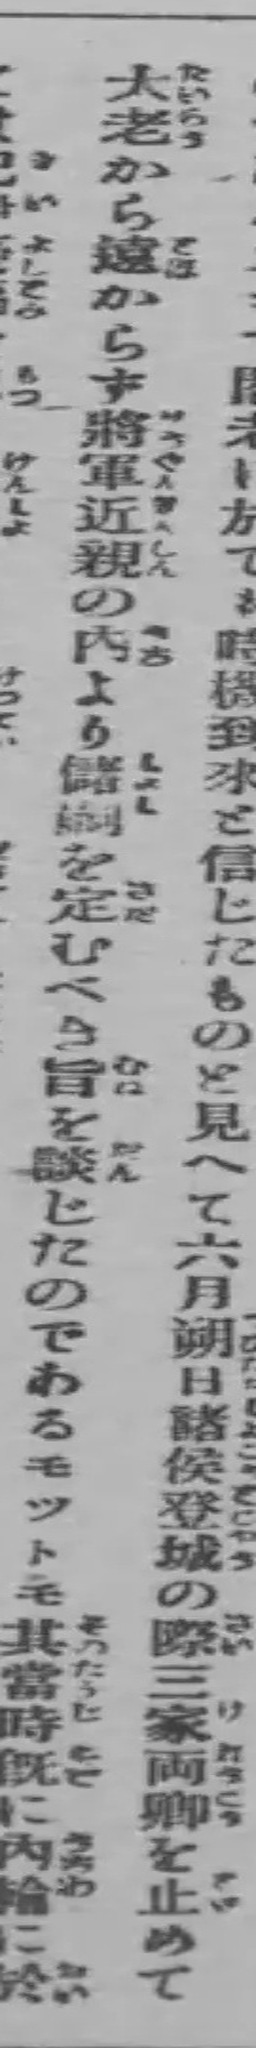大老から遠からず将軍近親の内より儲嗣を定むべき旨を談じたのであるモツトモ其当時既に内輪に於
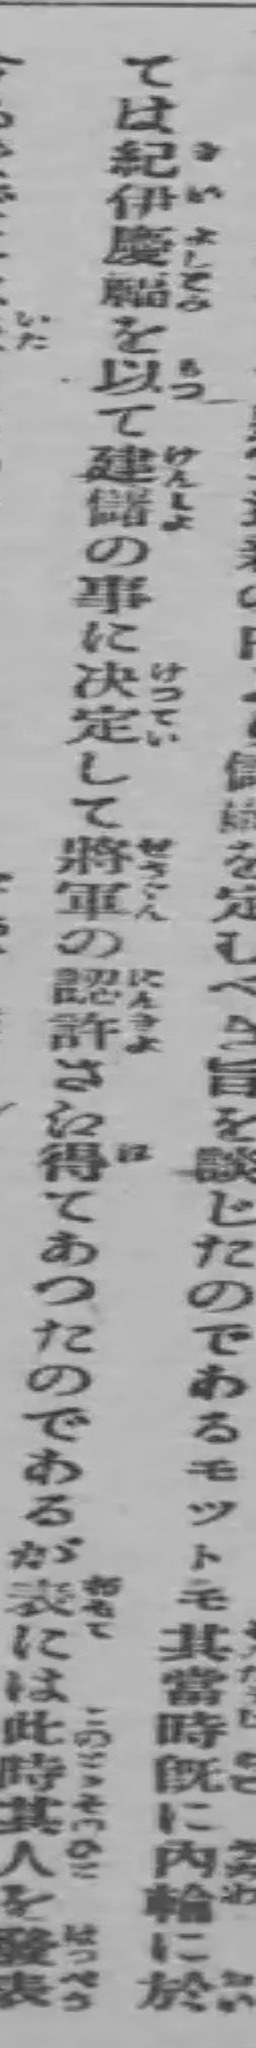ては紀伊慶福を以て建儲の事に決定して将軍の認許さえ得てあつたのであるが表には此時其人を発表
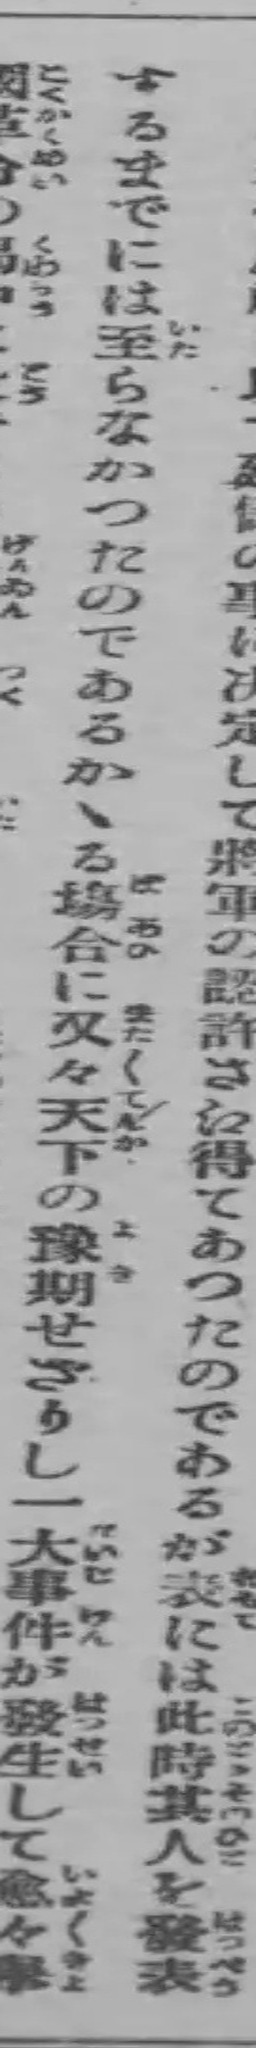するまでには至らなかつたのであるかゝる場合に又々天下の予期せざりし一大事件が発生して愈々挙
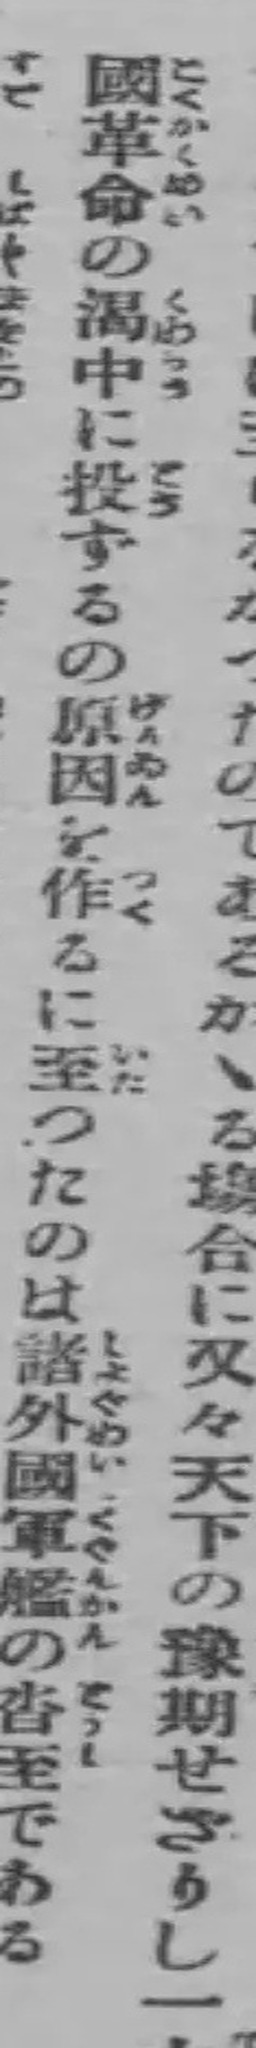国革命の渦中に投ずるの原因を作るに至つたのは諸外国軍艦の沓至である
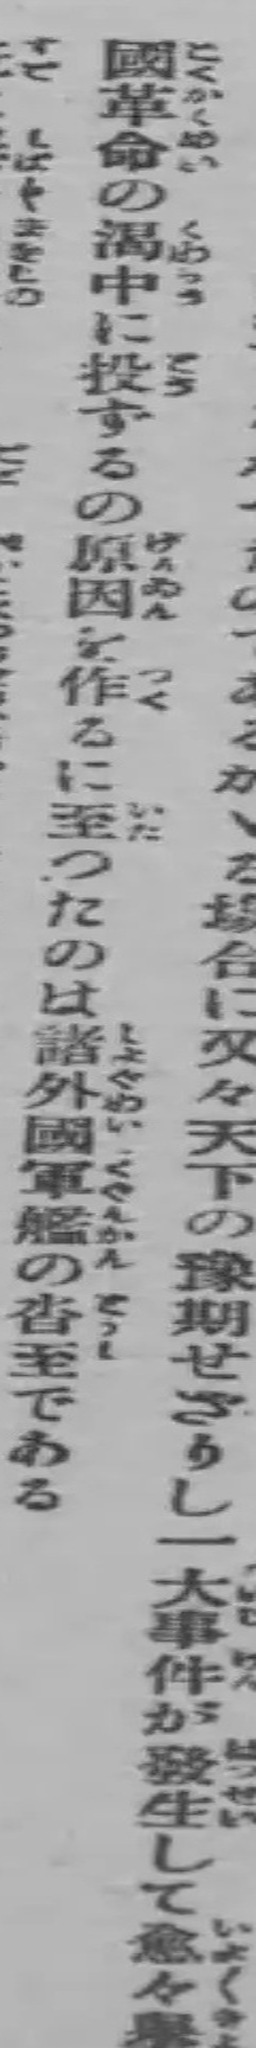国革命の渦中に投ずるの原因を作るに至つたのは諸外国軍艦の沓至である
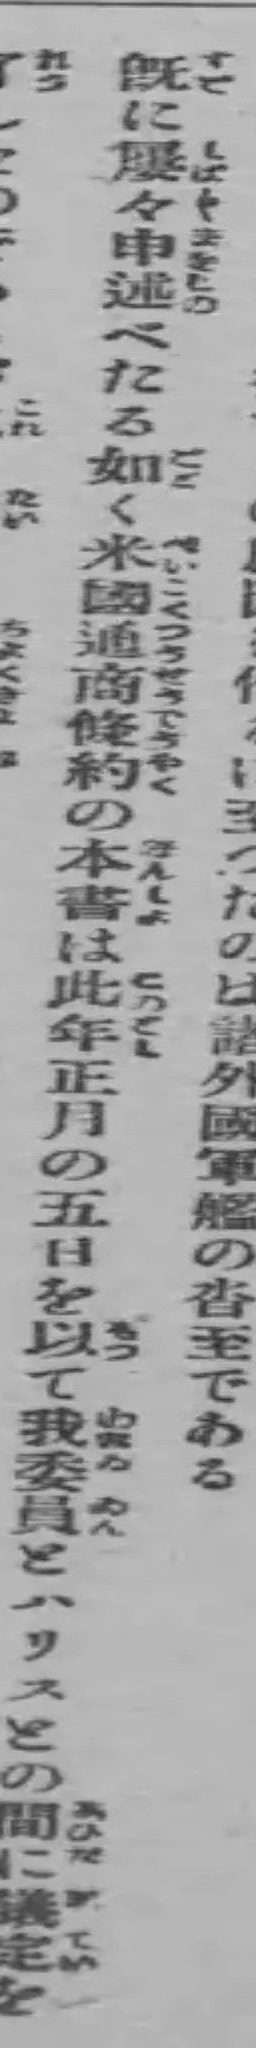既に屡々申述べたる如く米国通商条約の本書は此年正月の五日を以て我委員とハリスとの間に議定を
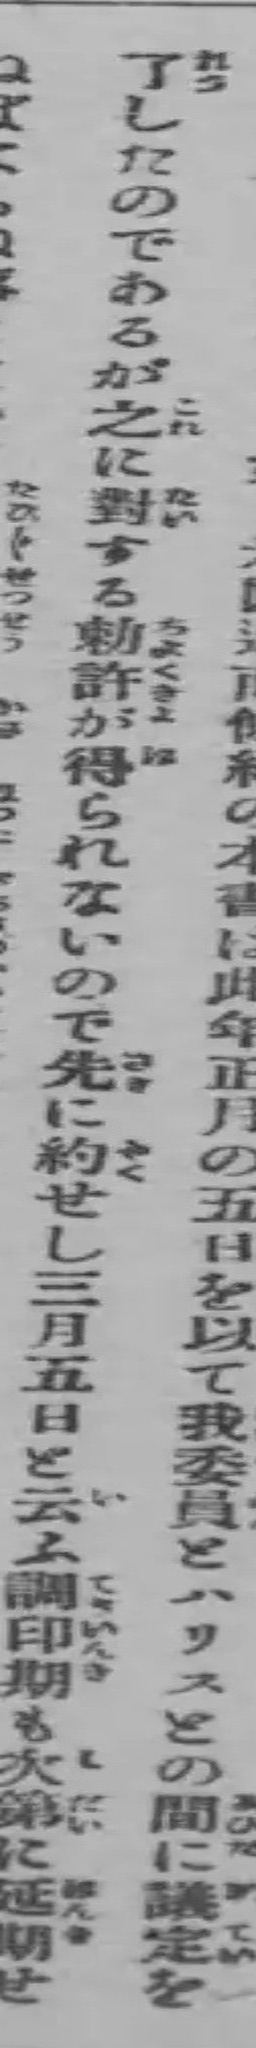了したのであるが之に対する勅許が得られないので先に約せし三月五日と云ふ調印期も次第に延期せ
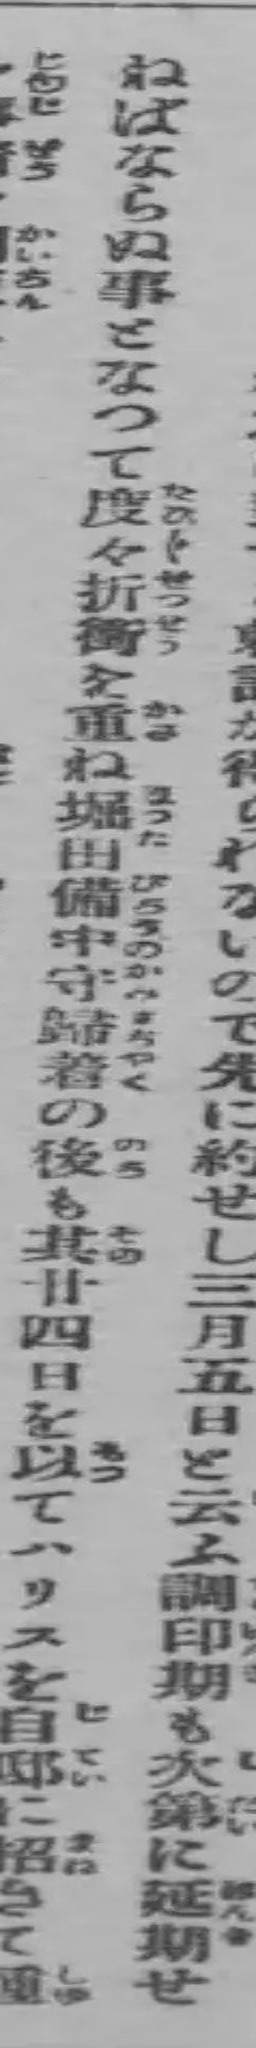ねばならぬ事となつて度々折衝を重ね堀田備中守帰着の後も其廿四日を以てハリスを自邸に招きて種
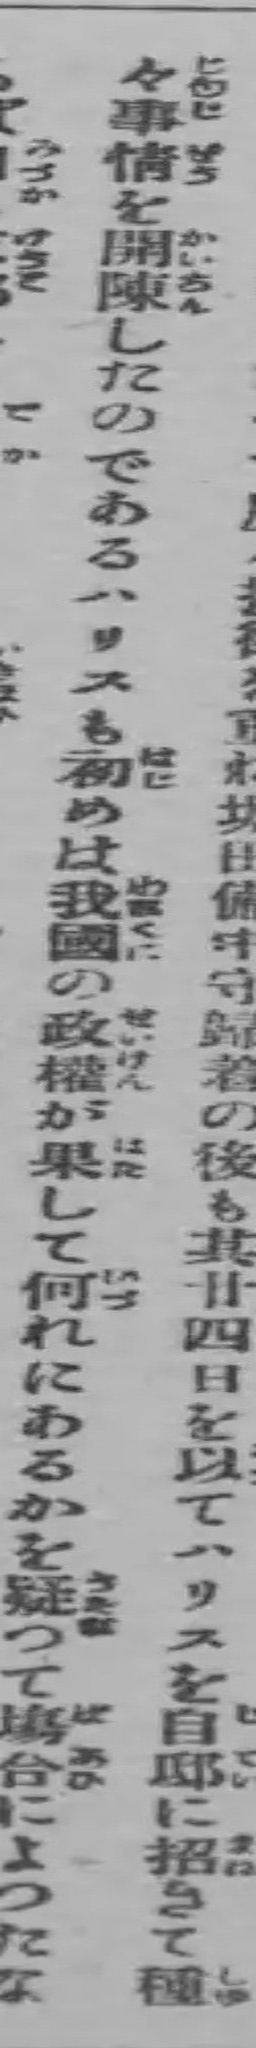種事情を開陳したのであるハリスも初めは我国の政権が果して何れにあるかを疑つて場合によつたな
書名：豊橋市史談
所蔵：国立国会図書館 National Diet Library, JAPAN
